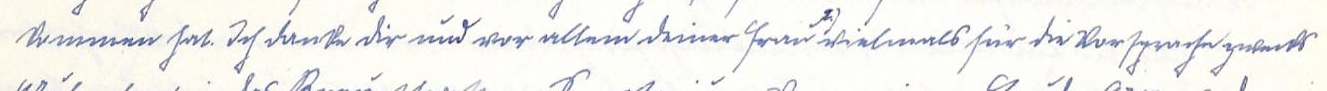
kommen hat. Ich danke Dir und vor allem deiner Frau vielmals für die Vorsprache zweckt
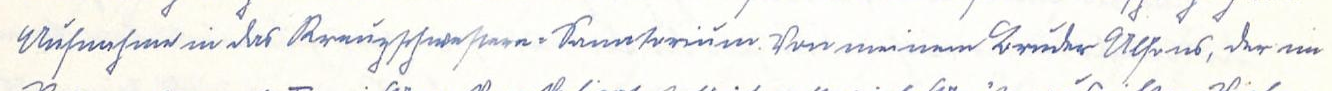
Aufnahme in das Kreuzschwestern- Sanatorium. Von meinem Bruder Alfons, der im
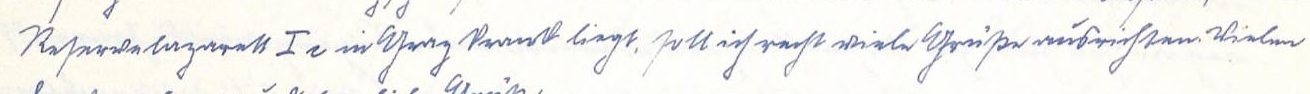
Reservelazarett Ic in Graz krank liezt, soll ich recht viele Grüße ausrichten. Vielen
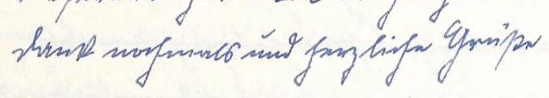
Dank nochmals und herzliche Grüße
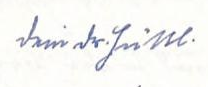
dein Dr Hüttl.
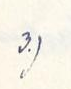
3)
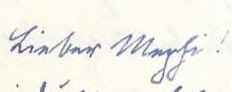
Lieber Mephi!
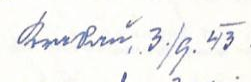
Krakau, 3./9. 43
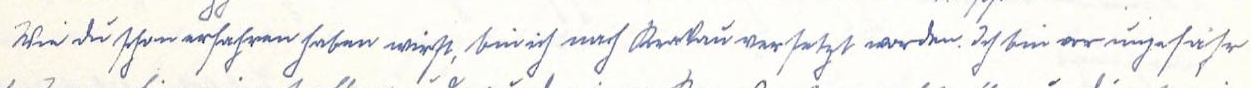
Wie du schon erfahren haben wirst, bin ich nach Krakau versetzt worden. Ich bin vor ungefähr
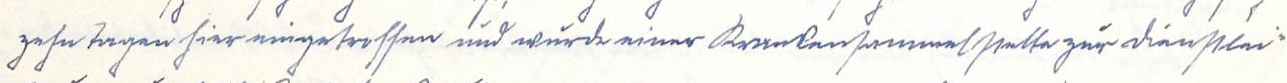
zehn Tagen hier eingetroffen und wurde einer Krankensammelstelle zur Dienstle-i
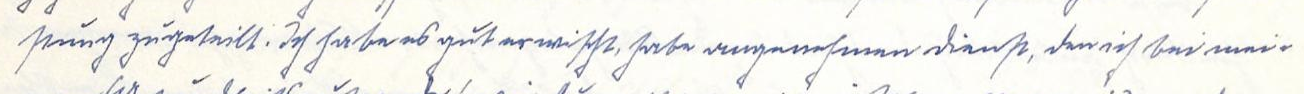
stung zugeteilt. Ich habe es gut erwischt, habe angenehmen Dienst, den ich bei mei-
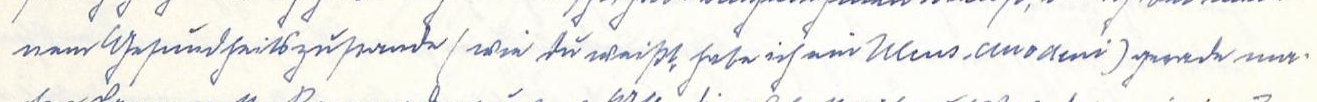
nem Gesundheitszustande (wie du weißt habe ich ein Ulcus duodeni)gerade ma-
